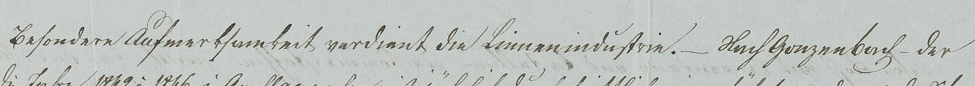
Besondere Aufmerksamkeit verdient die Linnenindustrie. – Nach Gonzenbach – der
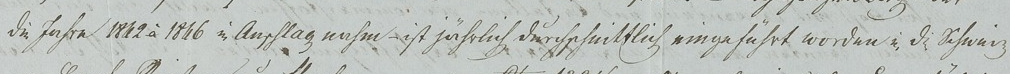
die Jahre 1842 à 1846 in Anschlag nahm – ist jährlich durchschnittlich eingeführt worden in die Schweiz
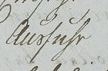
Auslande
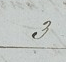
u.
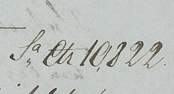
der Arbeitslohn
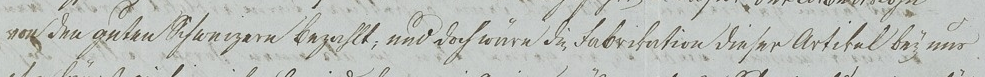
von den guten Schweizern bezahlt; und doch wäre die Fabrikation dieser Artikel bey uns
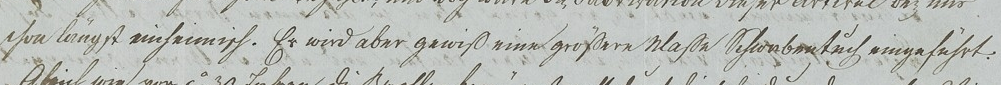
schon längst einheimisch. Es wird aber gewiß eine größere Masse Schwabentuch eingeführt.
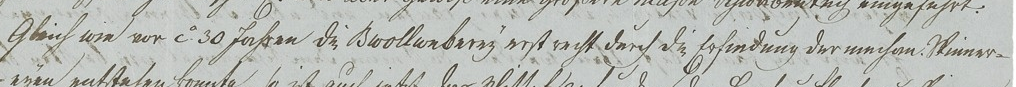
Gleich wir vor ca 30 Jahren die Bwoll weberey erst recht durch die Erfindung der mechan. Spinner-
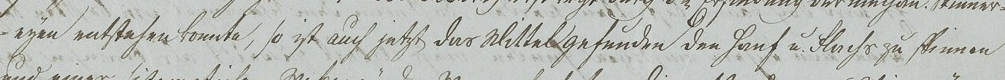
eyen entstehen konnte, so ist auch jetzt das Mittel gefunden den Hanf u. Flachs zu spinnen
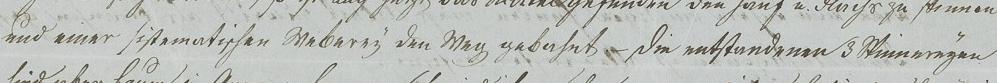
und einer sistematischen Weberey den Weg gebahnt, – die entstandenen 3 Spinnereyen
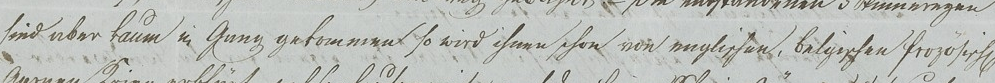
sind aber kaum in Gang gekommen so wird ihnen schon von englischen, belgischenfranzösischen
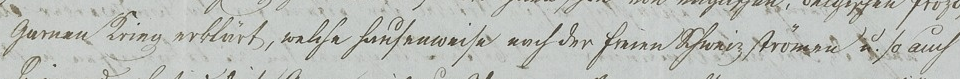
Garnen Krieg erklärt, welche haufenweise nach der freien Schweiz strömen u. so auch
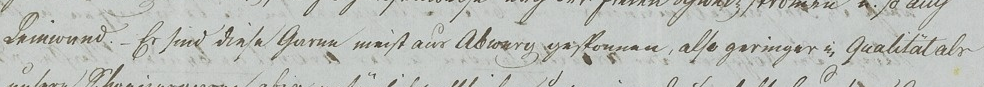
Leinwand. – Es sind diese Garne meist aus Abwerg gesponnen, also geringer in Qualität als
